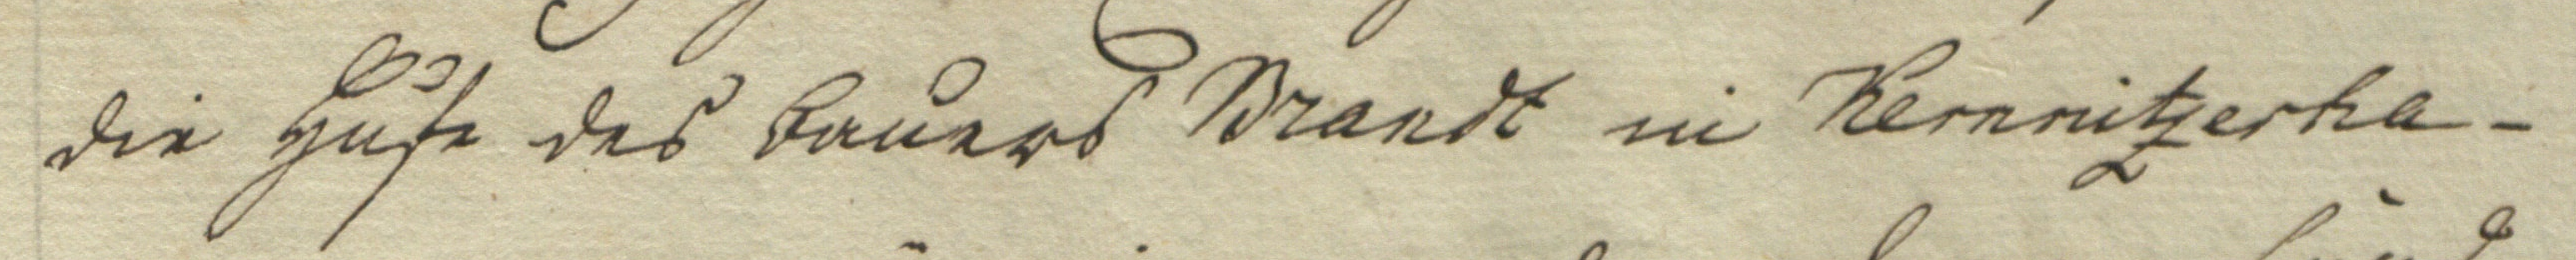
die Hufe des Bauers Brandt in Kemnitzerha¬
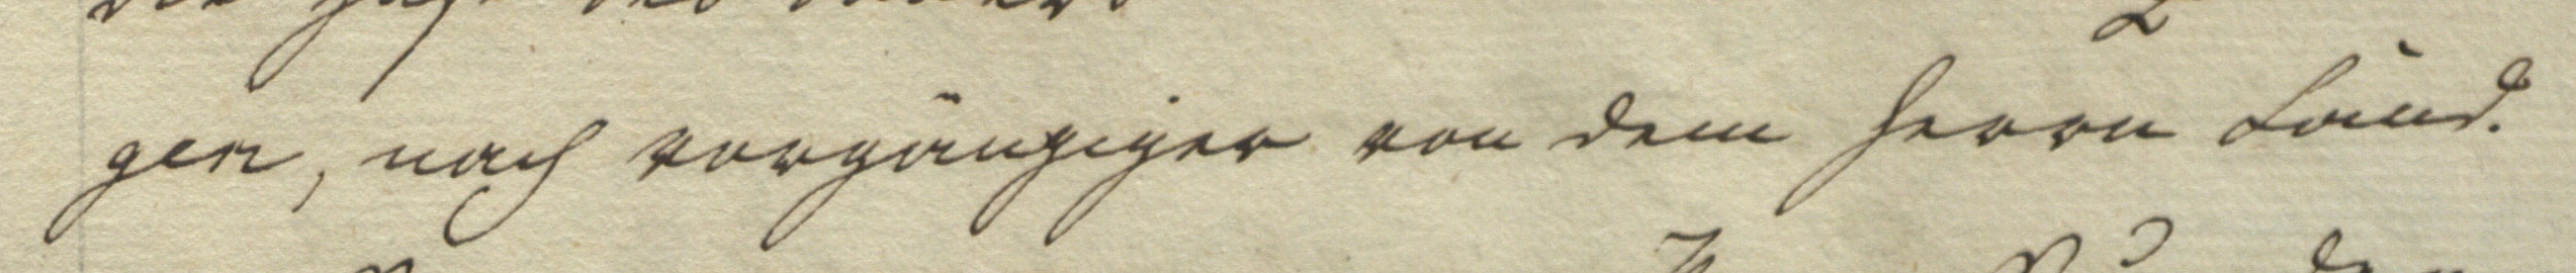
gen, nach vorgängiger von dem Herrn Land¬
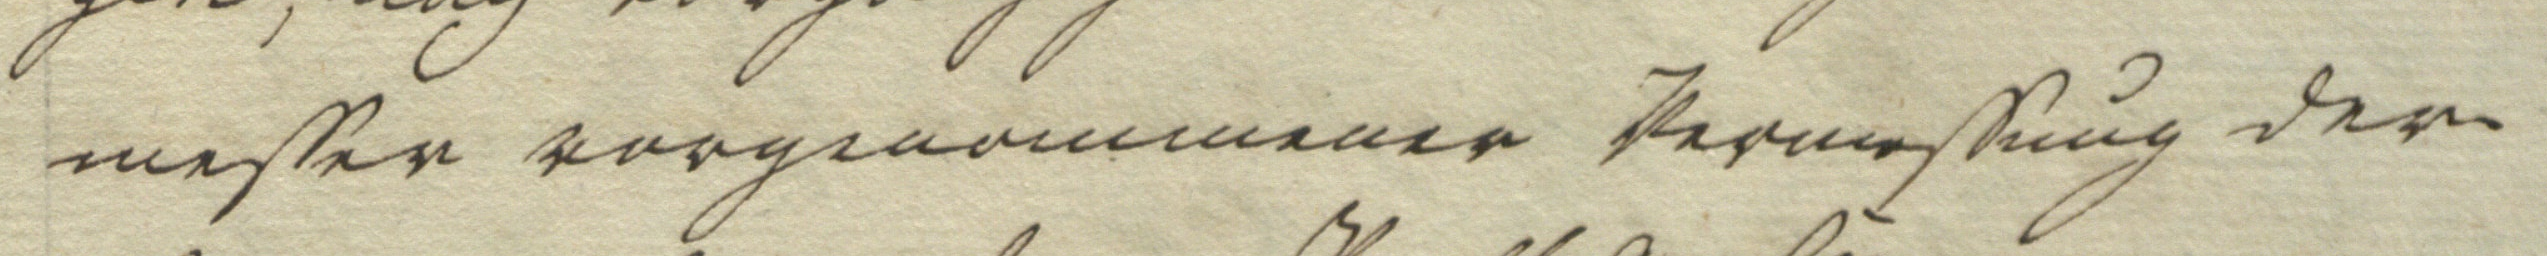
messer vorgenommener Vermessung der¬
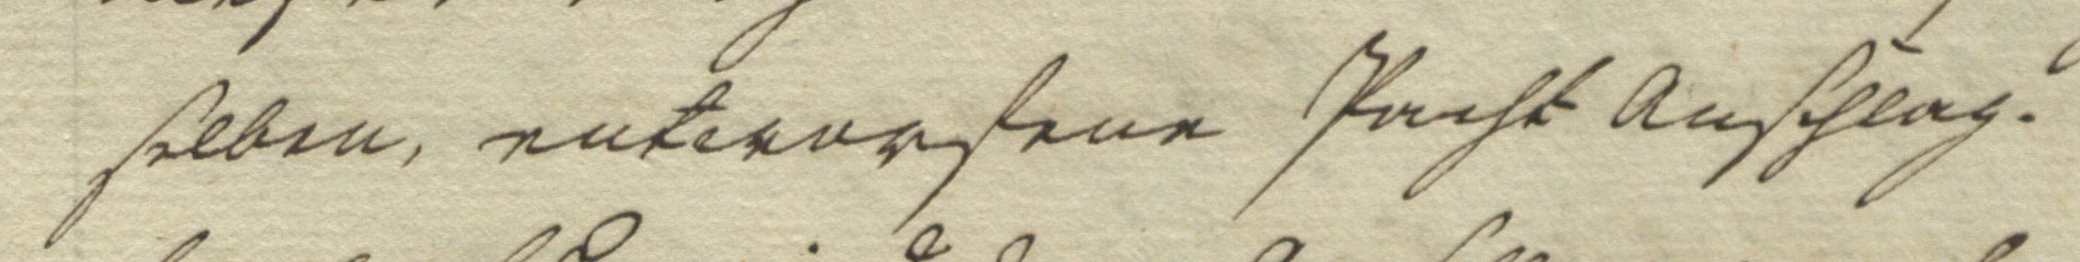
selben, entworfene Pacht Anschlag.
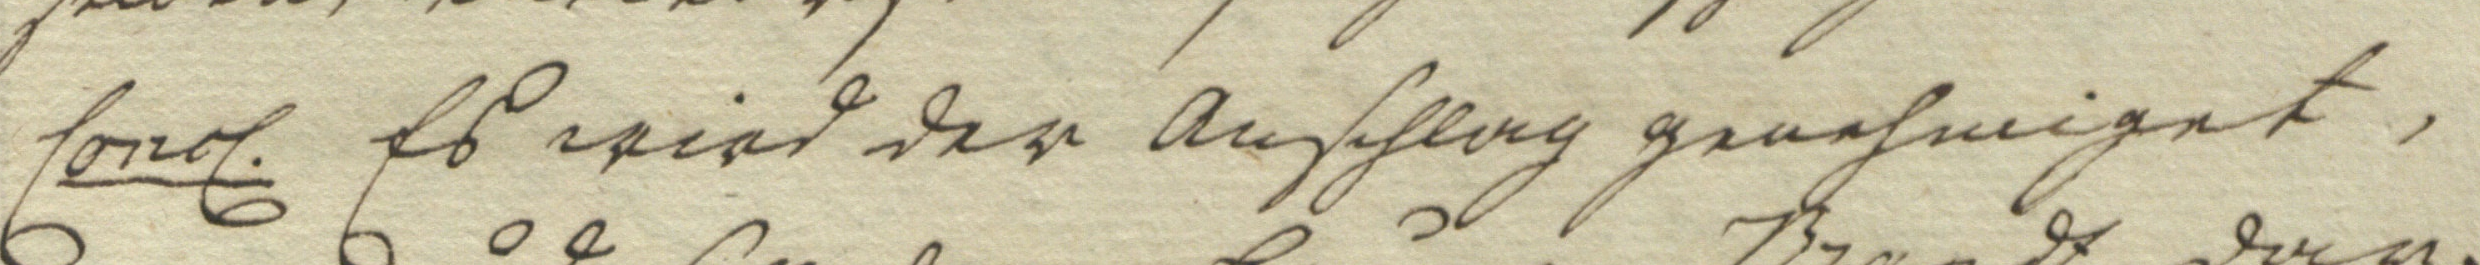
Concl. Es wird der Anschlag genehmiget,
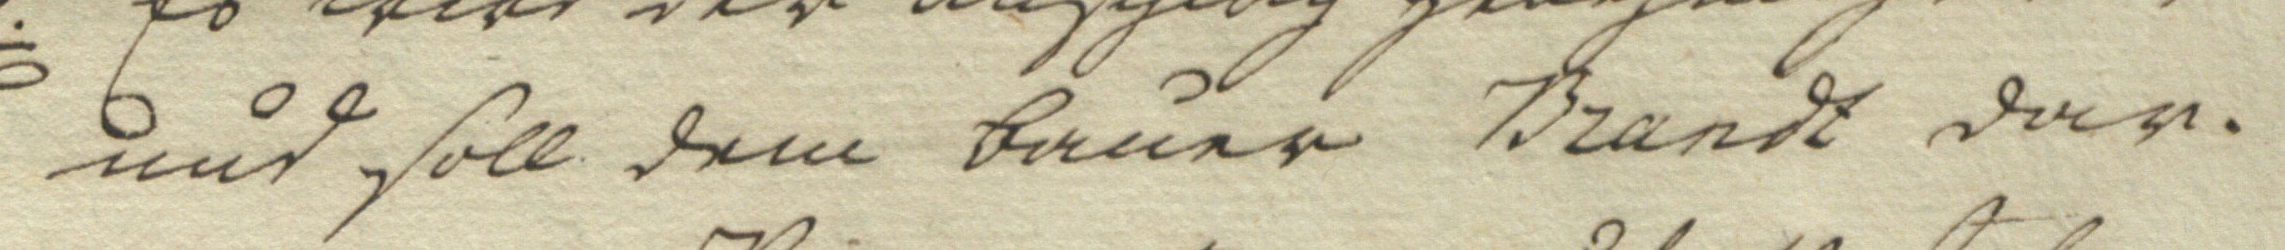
und soll dem Bauer Brand dar¬
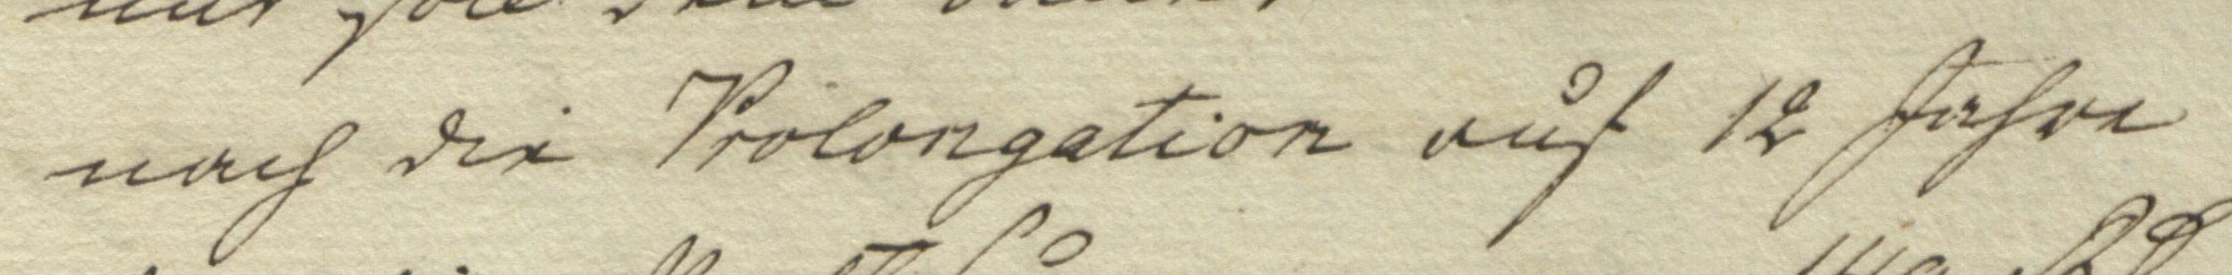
nach die Prolongation auf 12 Jahre
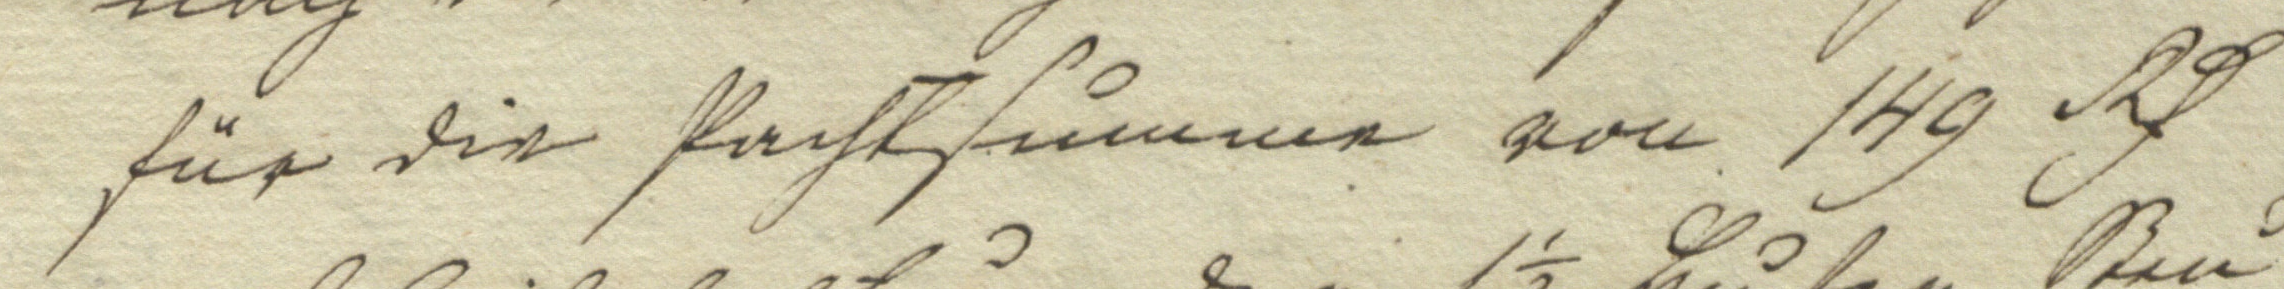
für die Pachtsumme von 149 Rf
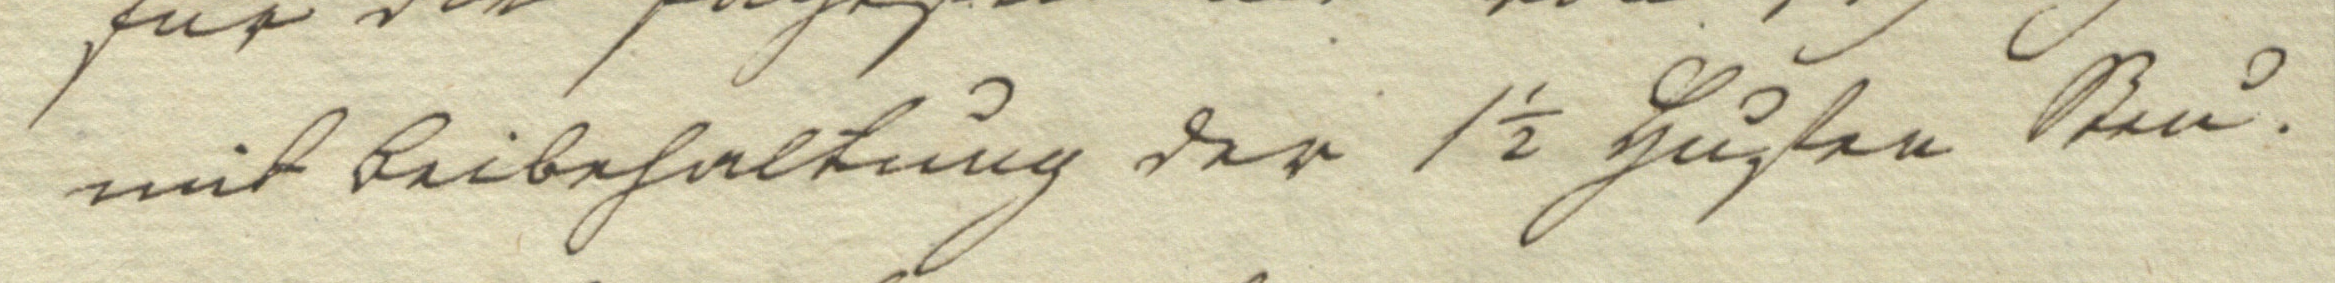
mit Beibehaltung der 1½ Hufen Steu¬
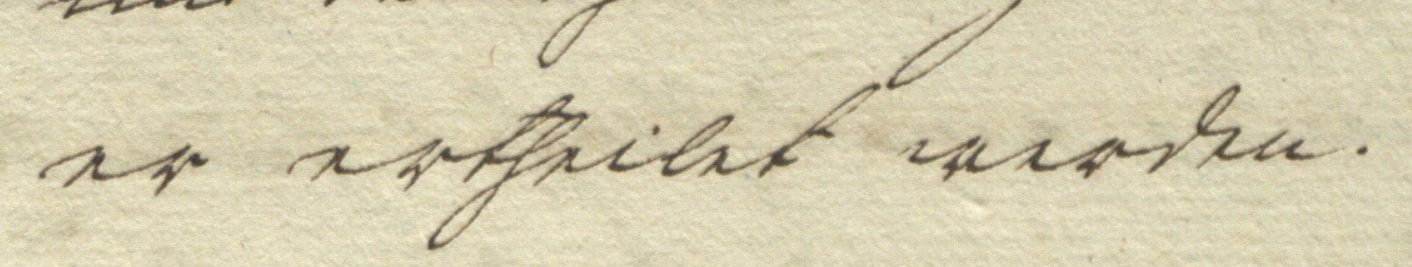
er ertheilet werden.
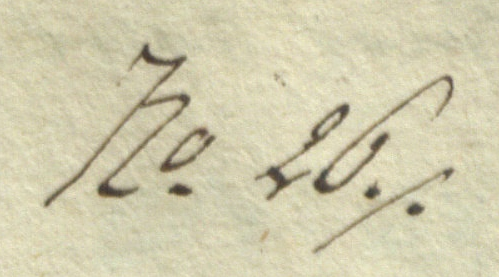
No 26.
